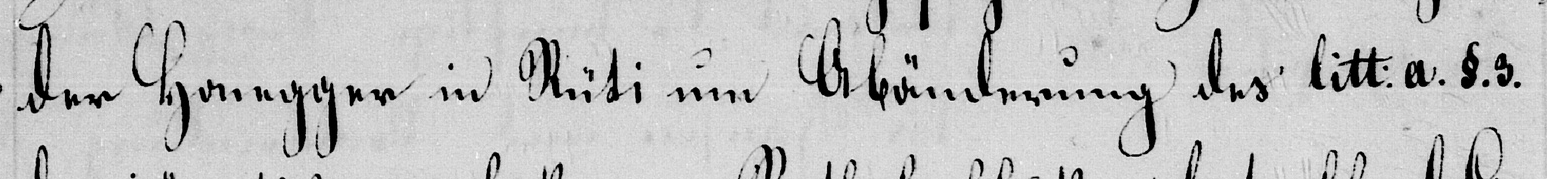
der Honegger in Rüti um Abänderung des litt: a. §. 3.
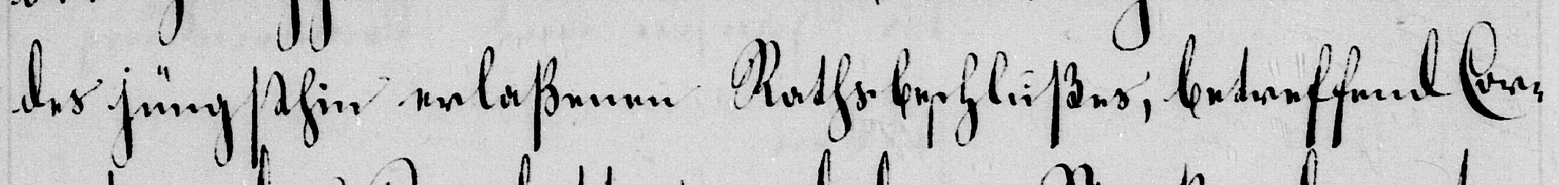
des jüngsthin erlaßenen Rathsbeschlußes, betreffend Cor¬
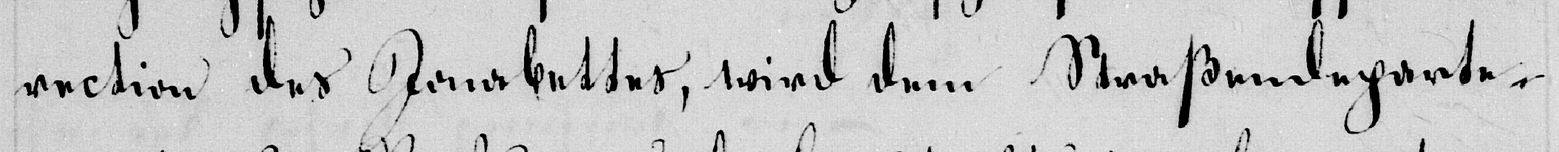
rection des Jonabettes, wird dem Straßendeparte¬
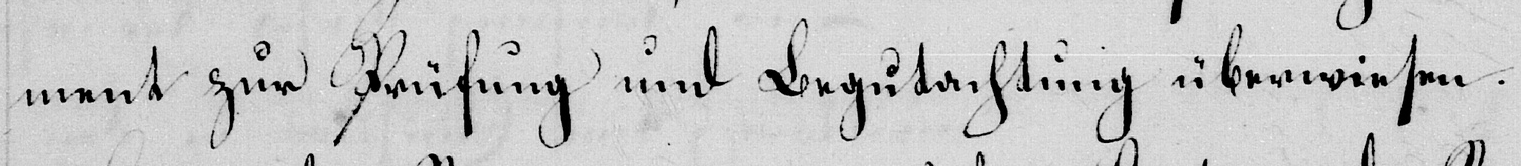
ment zur Prüfung und Begutachtung überwiesen.
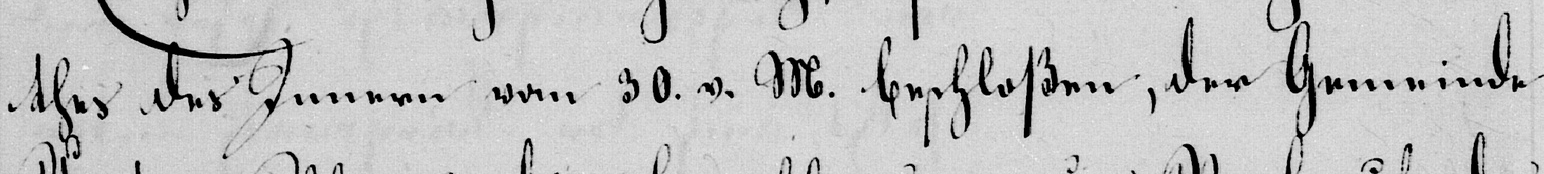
thes des Innern vom 30. v. M. beschloßen, der Gemeinde
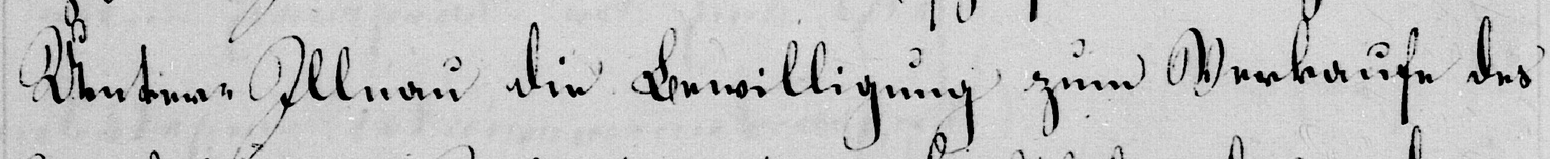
Unter-Illnau die Bewilligung zum Verkaufe des
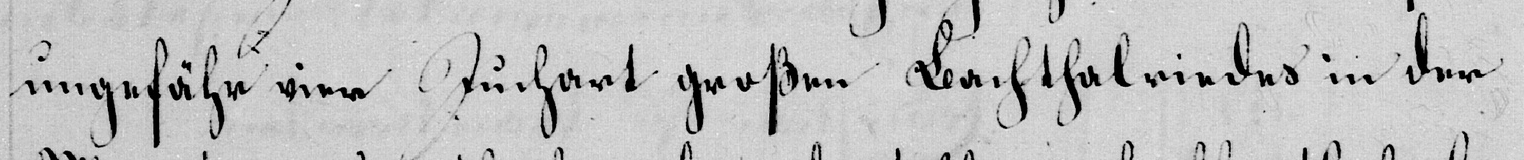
ungefähr vier Juchart großen Bachthalriedes in der
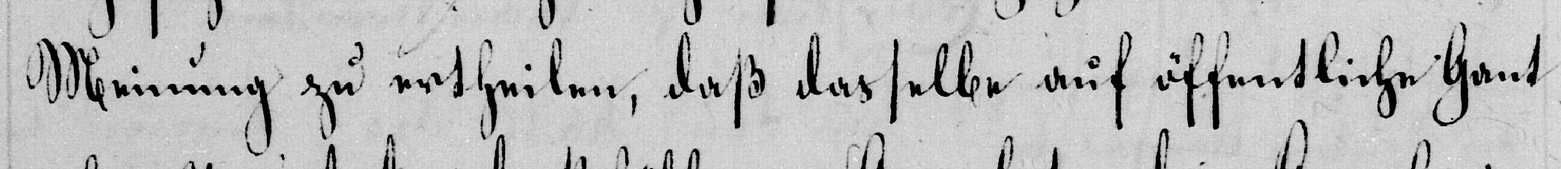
Meinung zu ertheilen, daß dasselbe auf öffentliche Gant
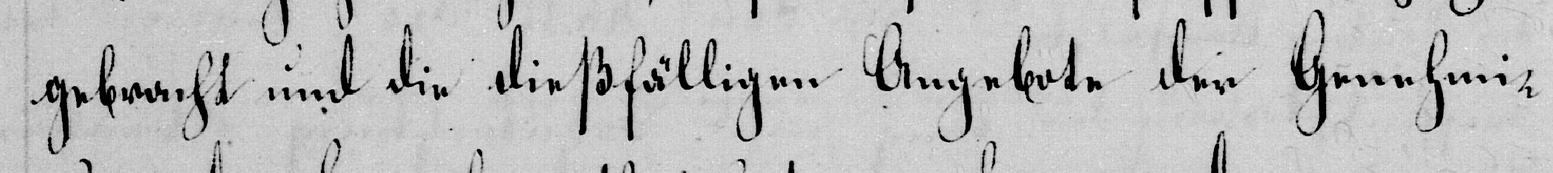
gebracht und die dießfälligen Angebote der Genehmi¬
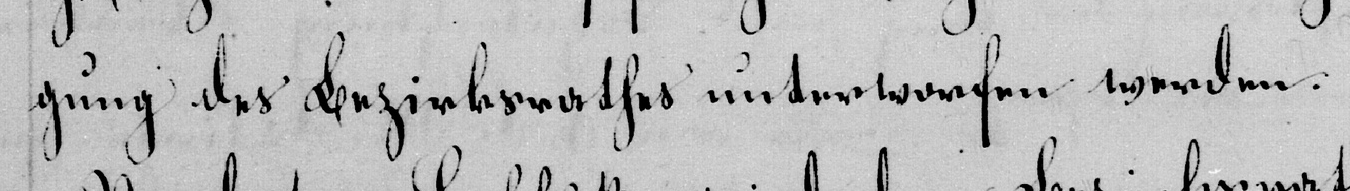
gung des Bezirksrathes unterworfen werden.
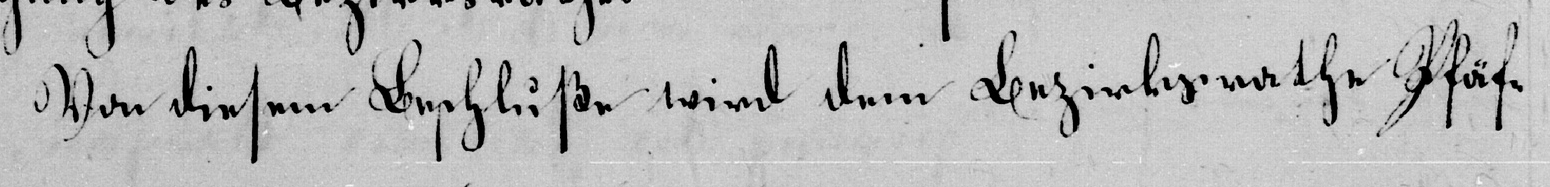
Von diesem Beschluße wird dem Bezirksrath Pfäf-
